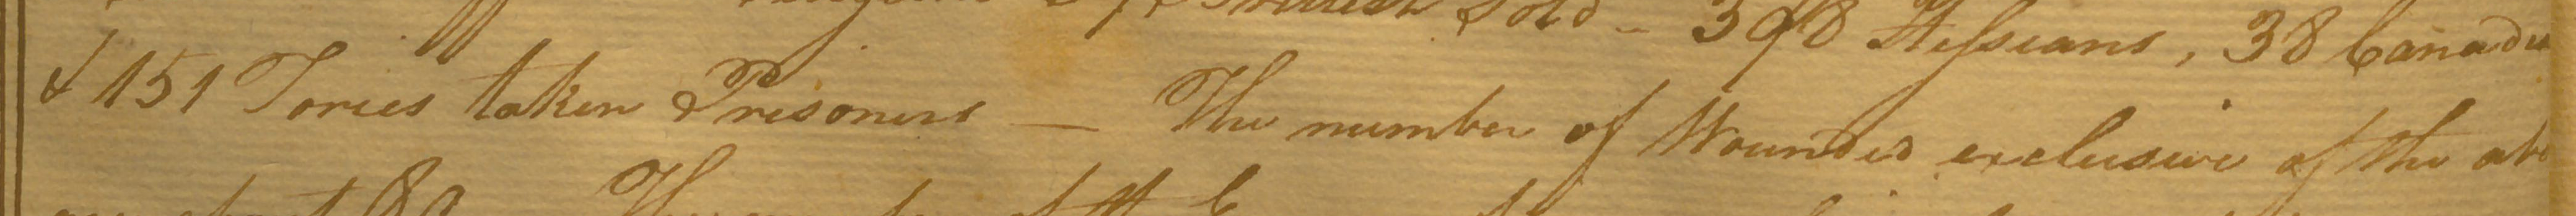& 151 Tories taken Prisoners- The number of Wounded exclusive of the ab
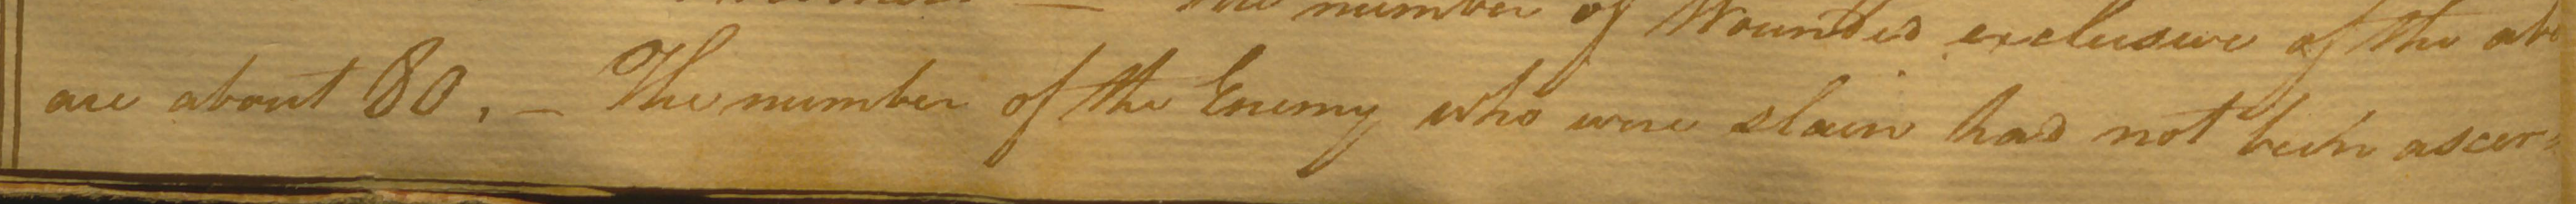are about 80.- The number of the Enemy who were slain has not been ascer
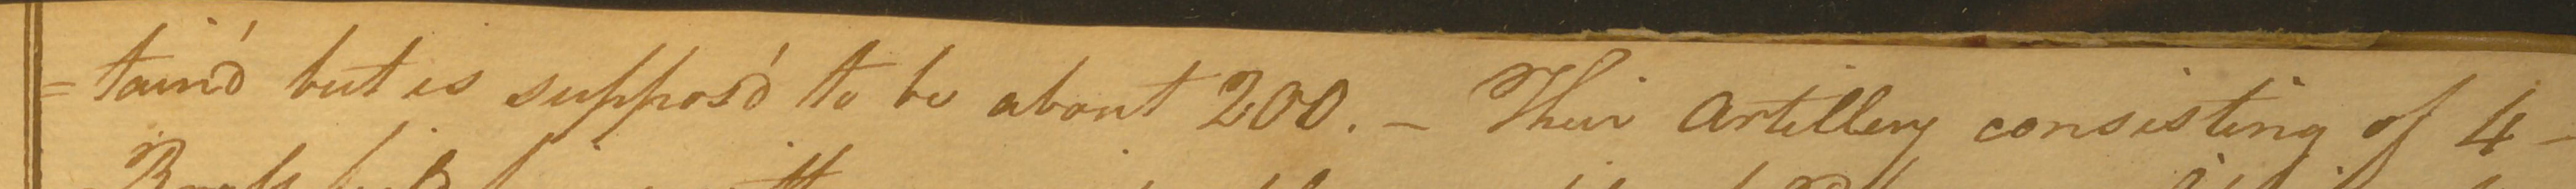-tain'd but is suppos'd to be about 200.- This artillery consisting of 4
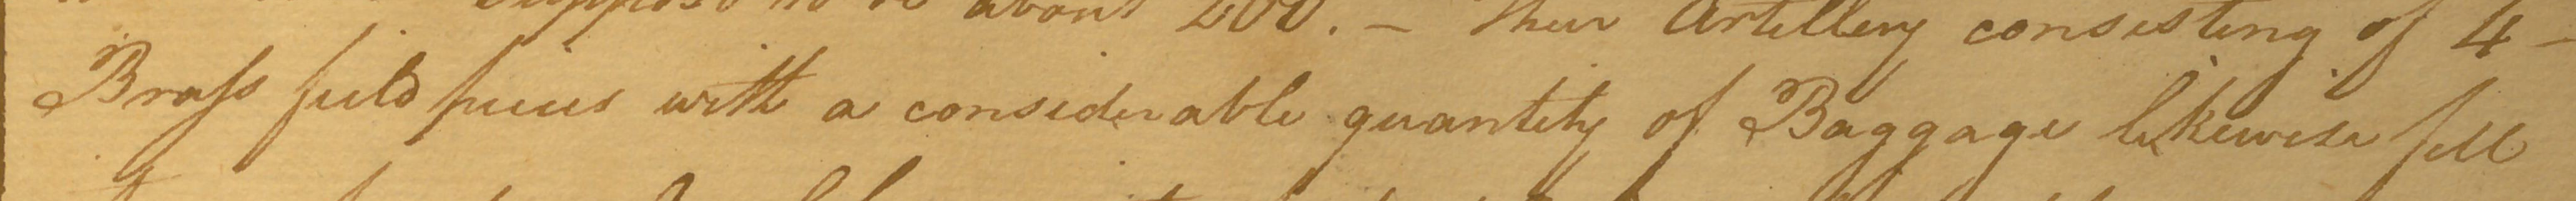Brass fieldpieces with a considerable quantity of Baggage likewise fell
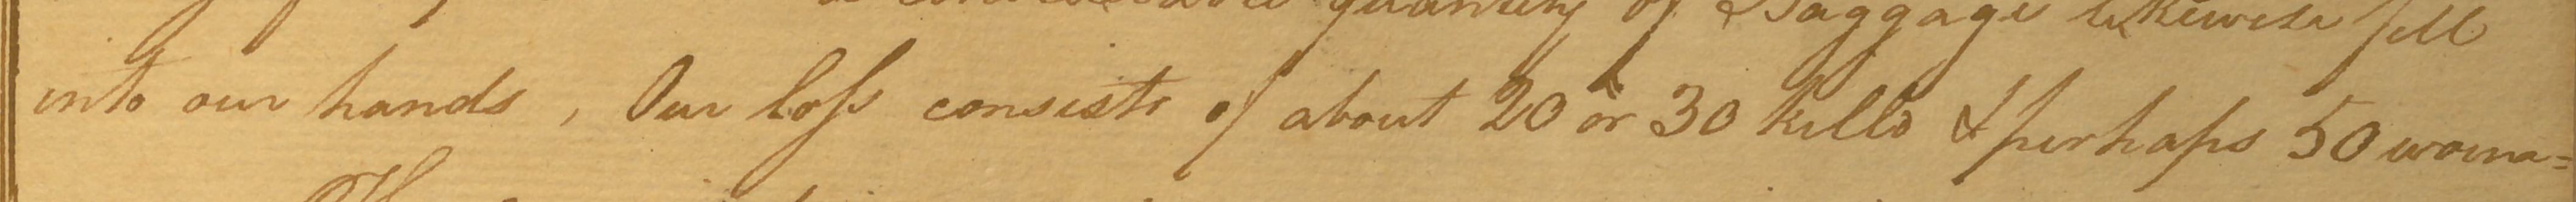into our hands. Our loss consist of about 20 or 30 killd & perhaps 50 woun-
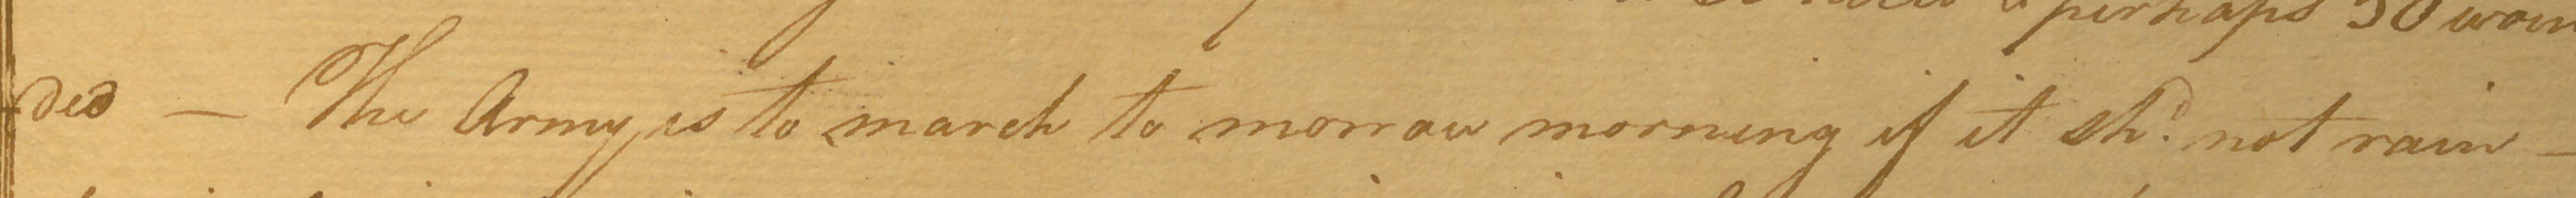ded- The Army is to march to morrow morning if it sh^d. not rain-
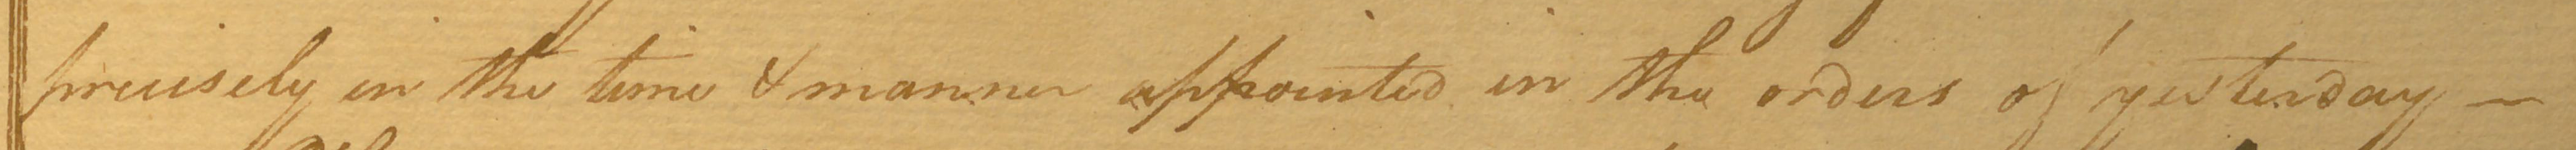precisely in the time & manner appointed in the orders of yesterday-
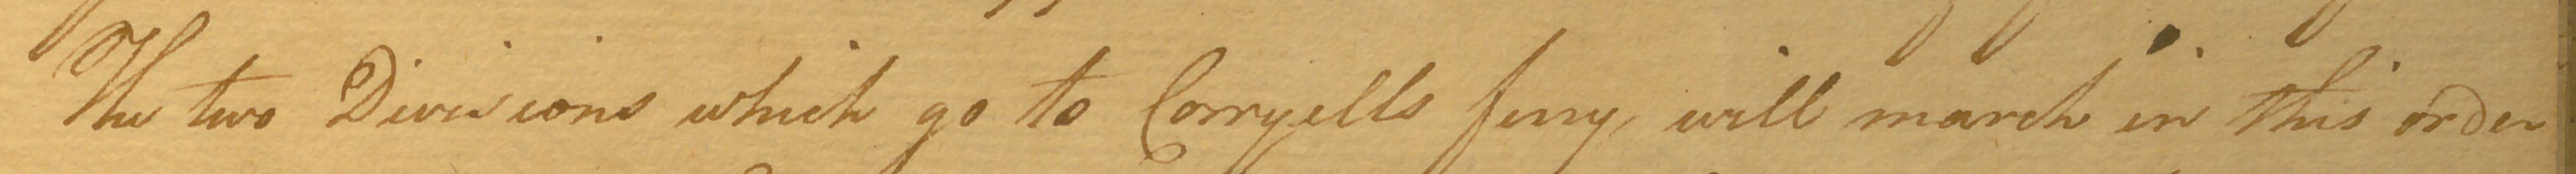The two Divisions which go to Corryells ferry will march in this order
